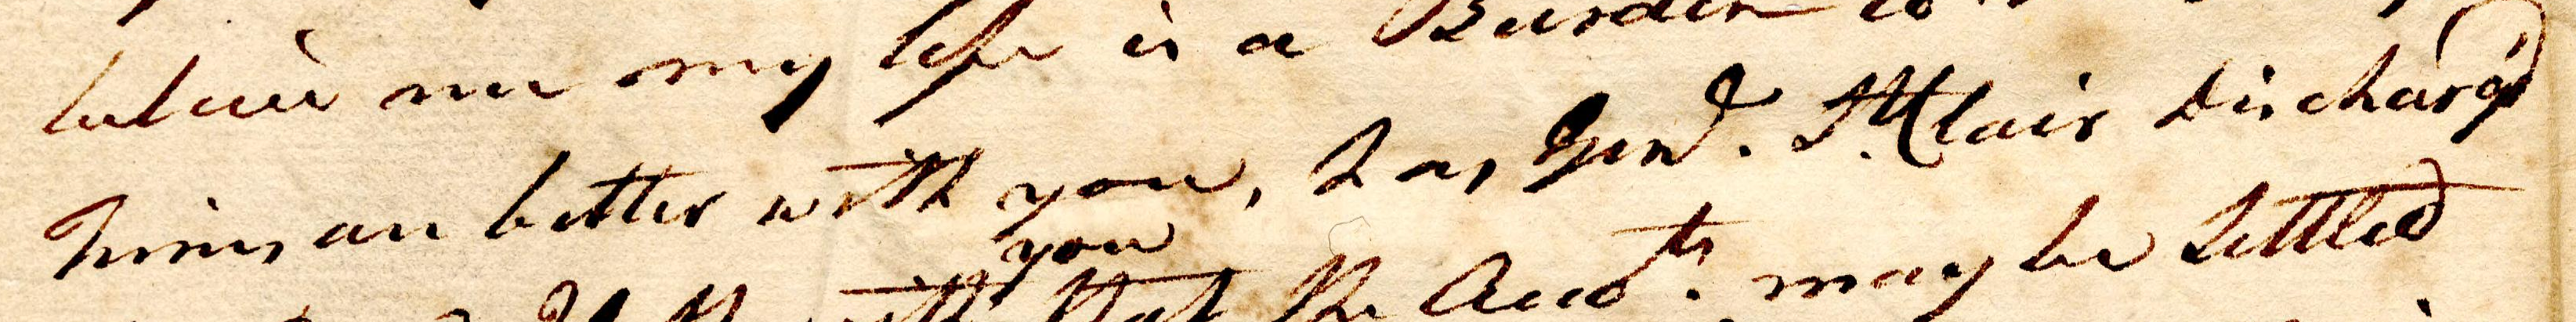times are better with you, has Gen^l. S^t. Clair dischargd
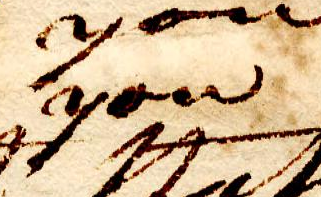you
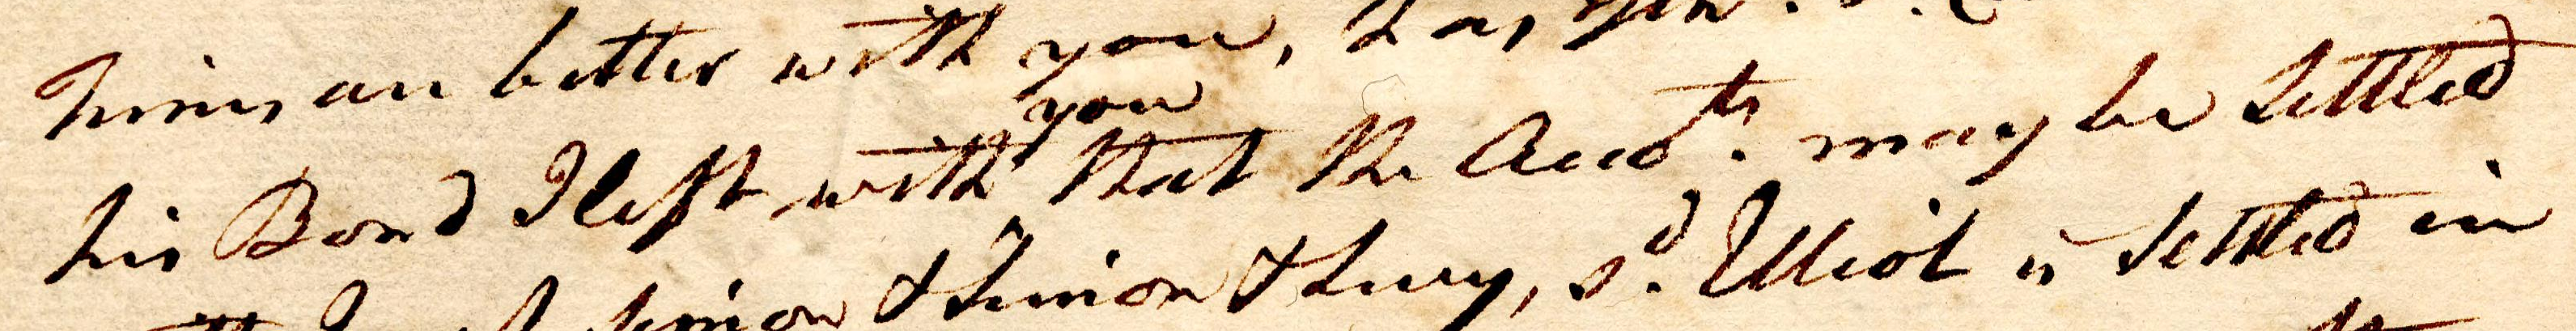his Bond I left with ^ that the Acco^t may be settled
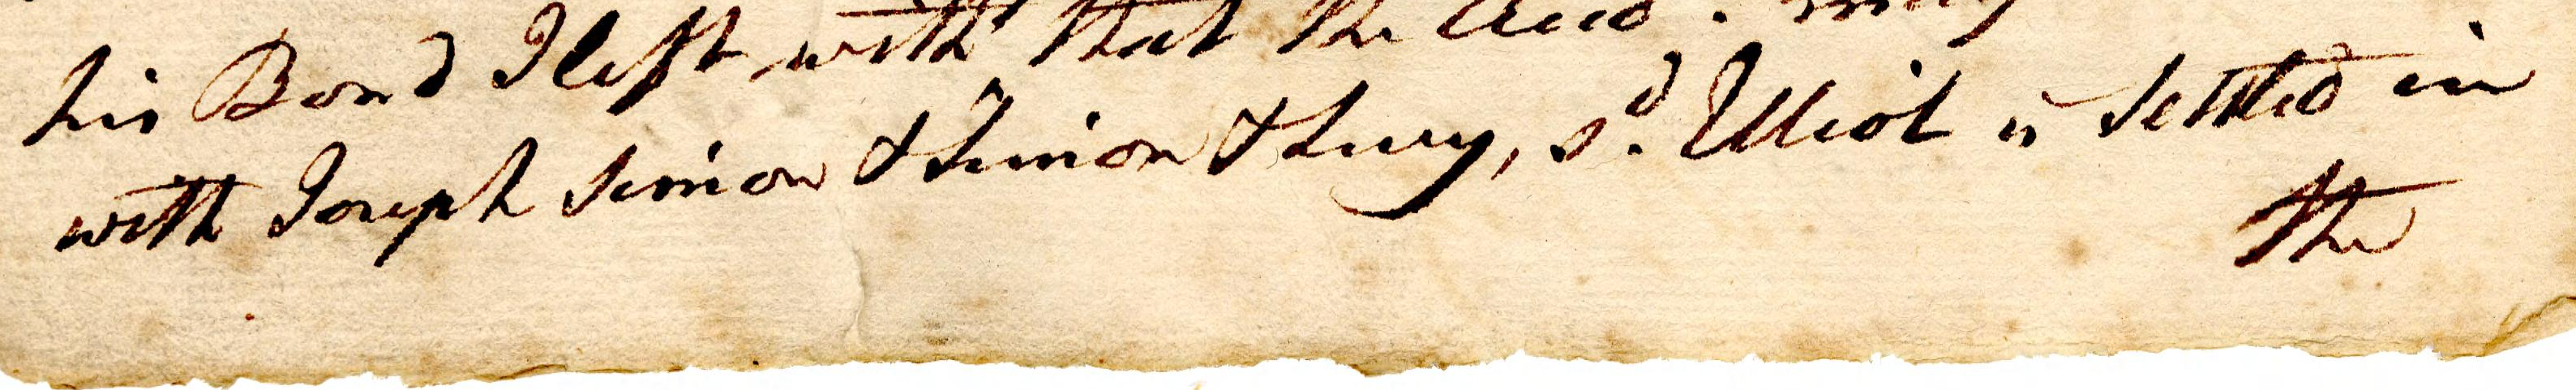with Joseph Simon & Simon & Lucy, s^d. Elliot is settled in
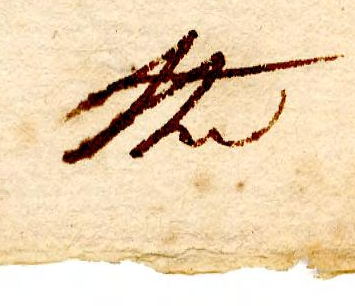the
